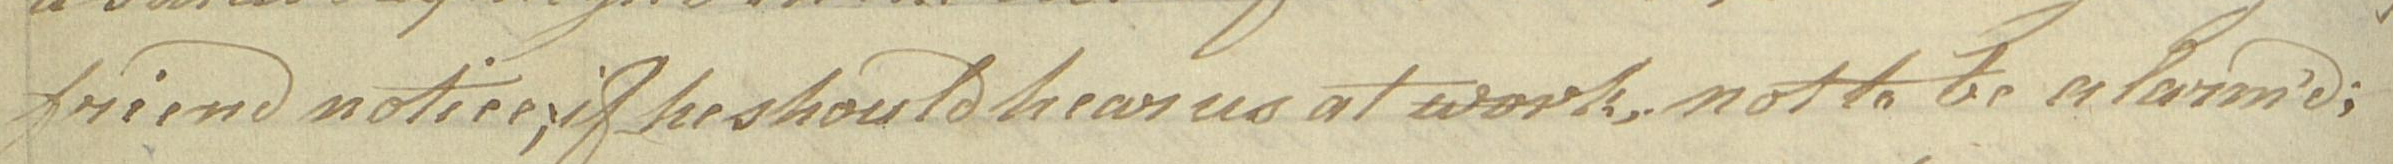friend notice, if he should hear us at work not to be alarm'd;
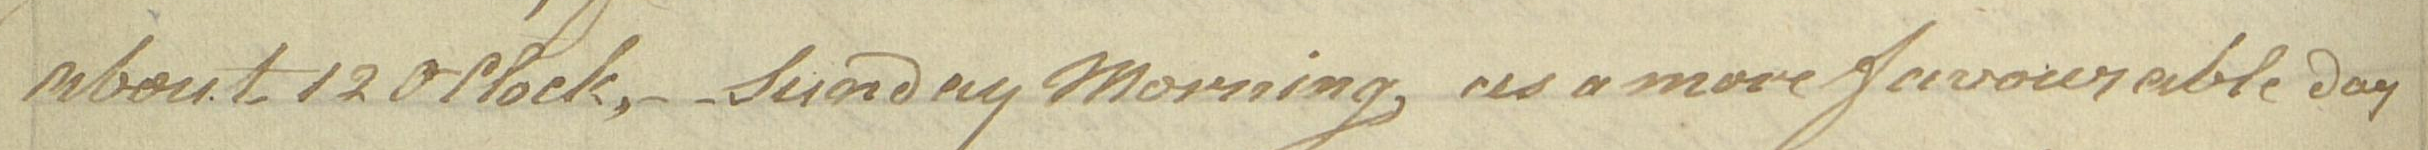about 12 OClock, Sunday Morning as a more favourable day
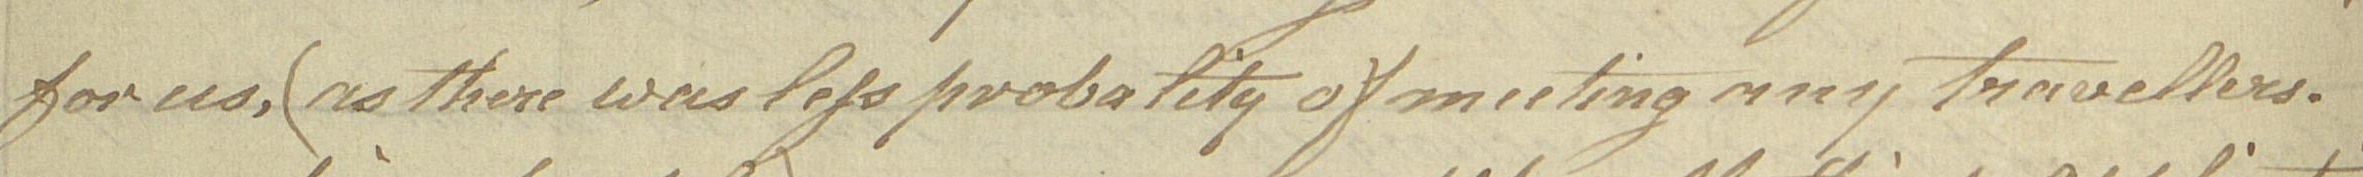for us as there was less probality of meeting any travelers.
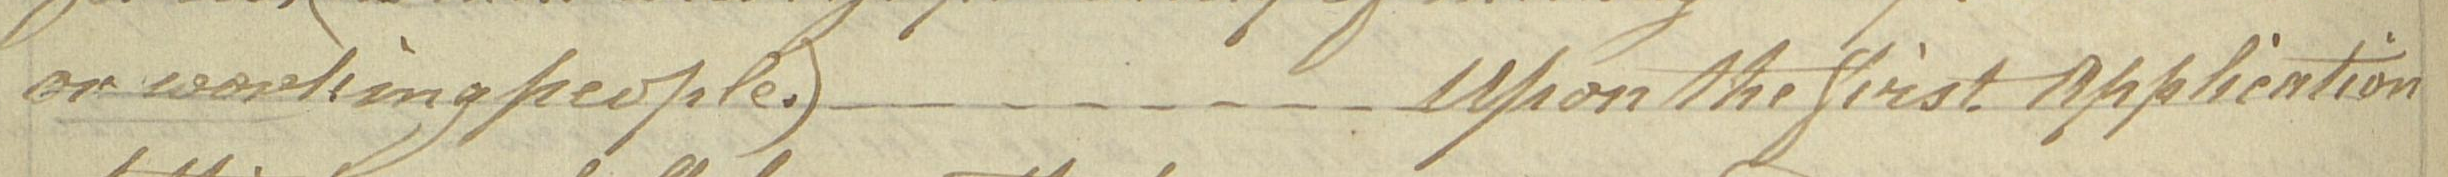on working people.) Upon the first Application
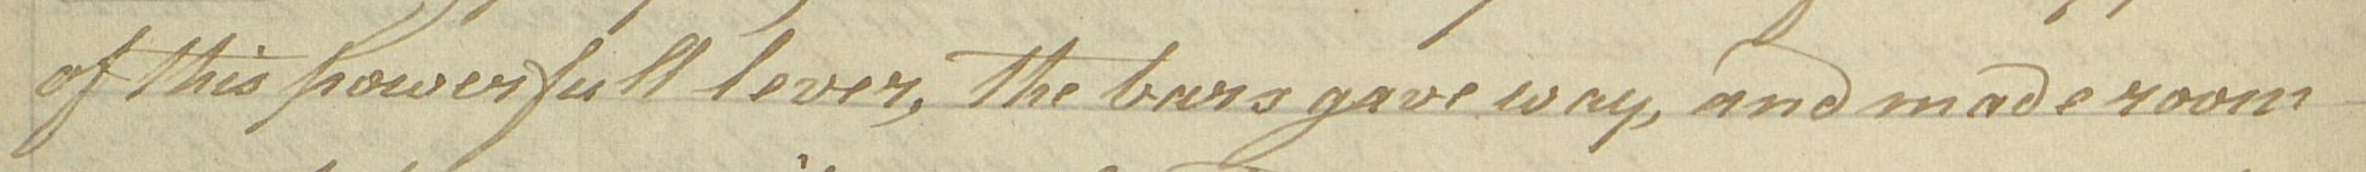of this powerfull lever; the bars give way and made room
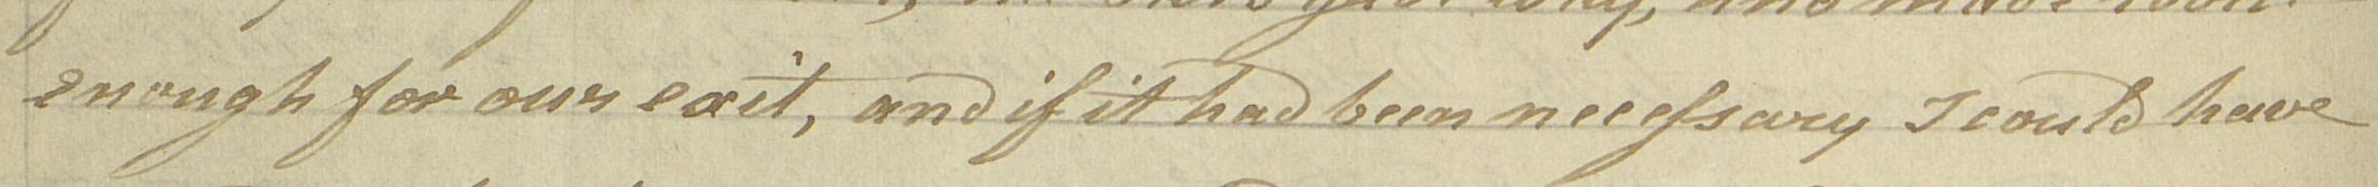enough for our exit, and if it had been necessary I could have
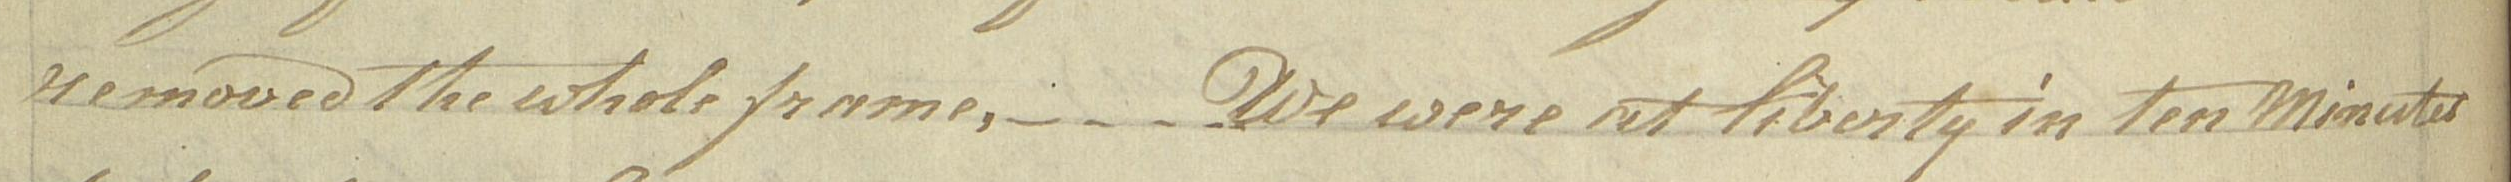removed the whole frame, We were at liberty in ten Minutes
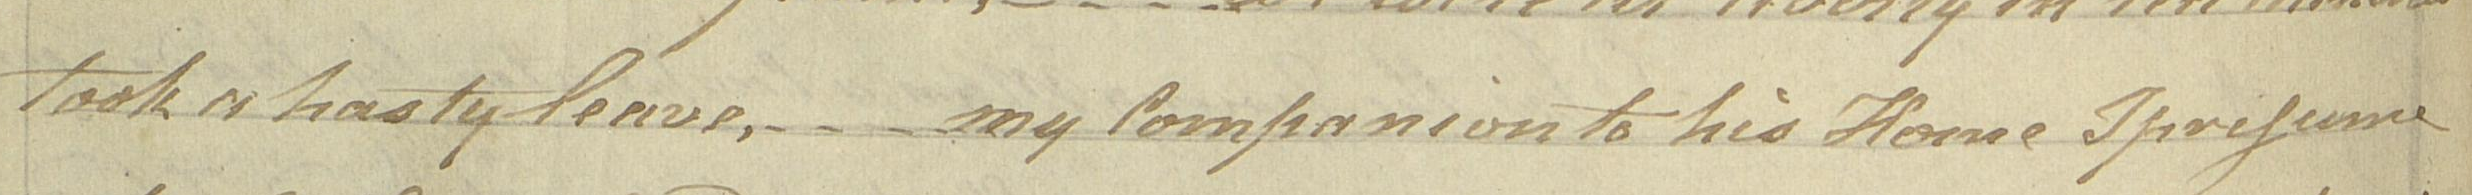took a hasty leave, my Companion to his Home I presume
